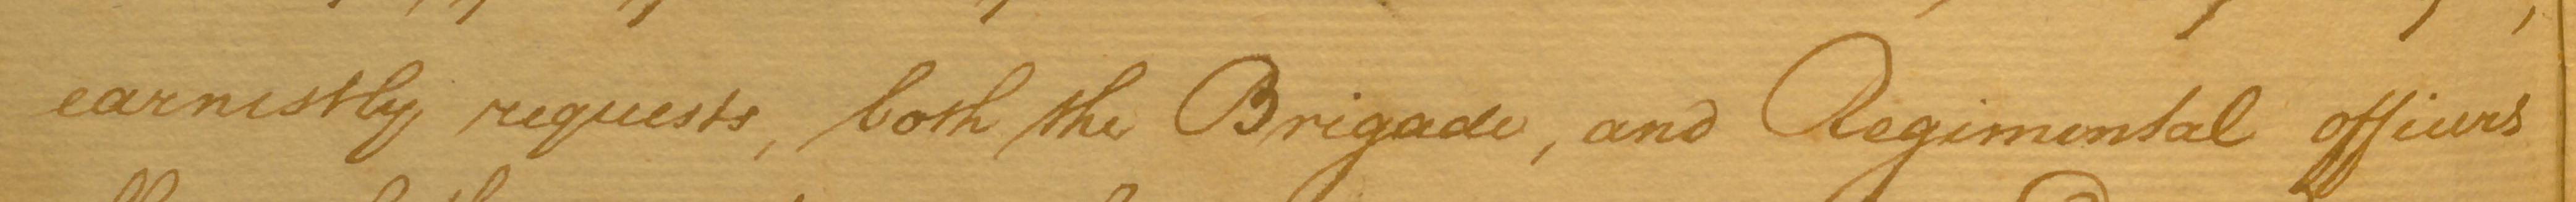earnestly requests, both the Brigade, and Regimental officers
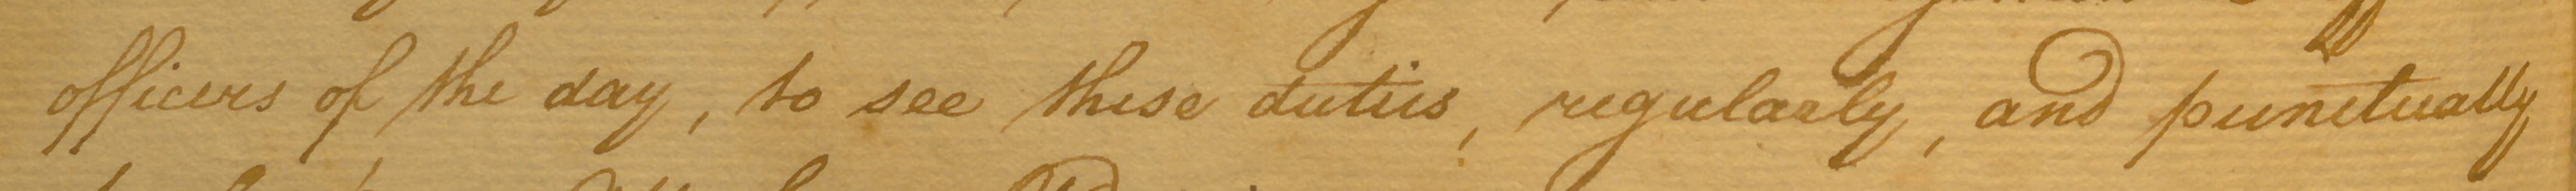officers of the day, to see these duties, regularly, and punctually
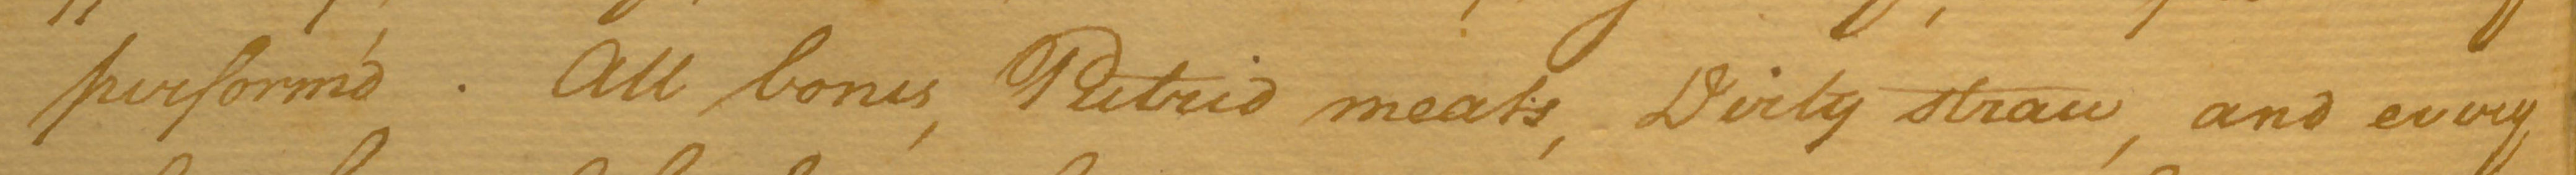perform'd. All bones, Putrid meats, Dirty straw, and every
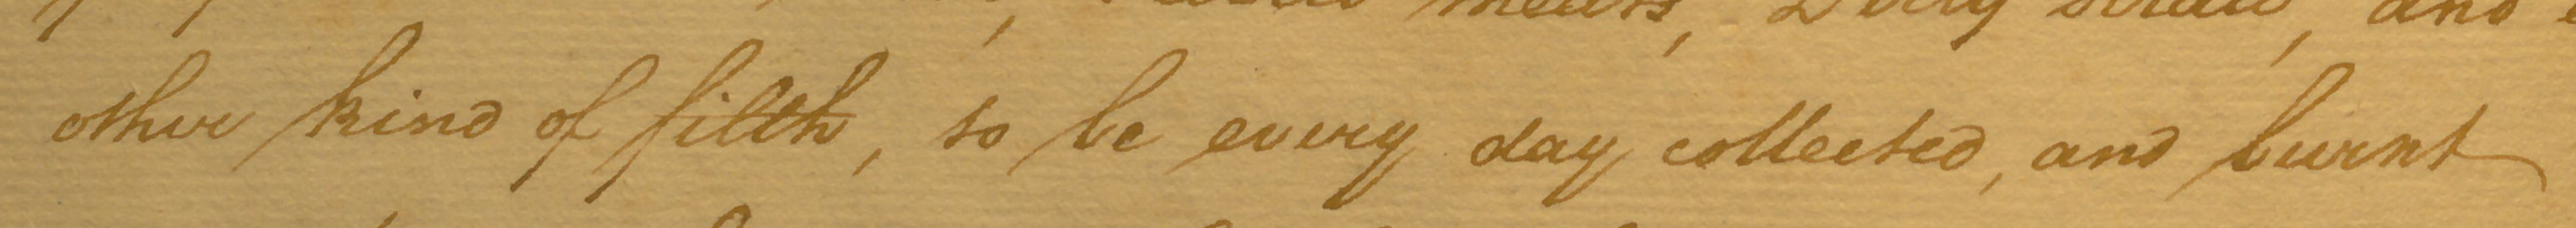other kind of filth, to be every day collected, and burnt
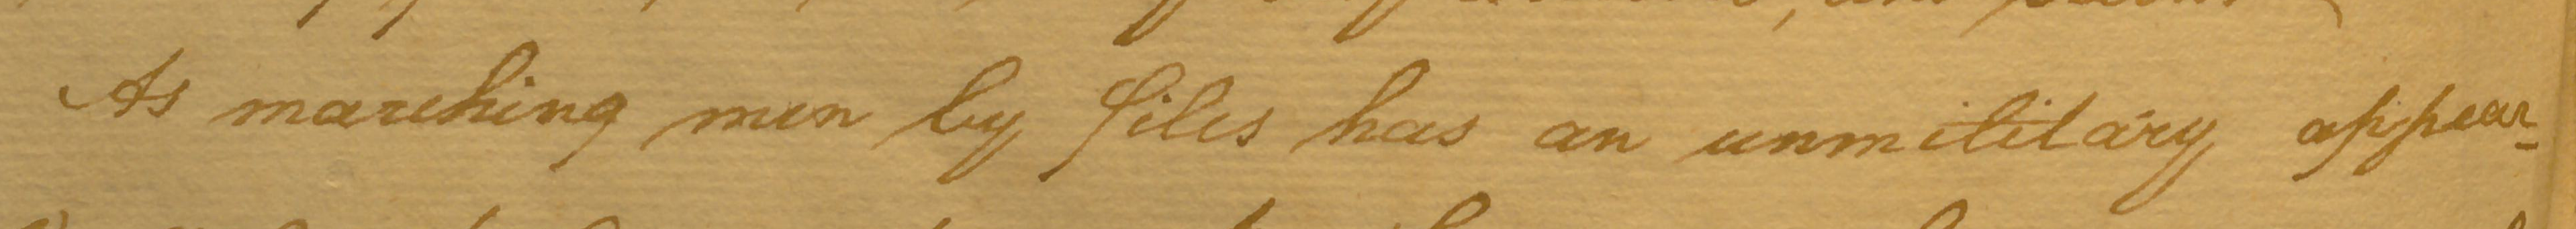As marching men by files has an unmilitary appear-
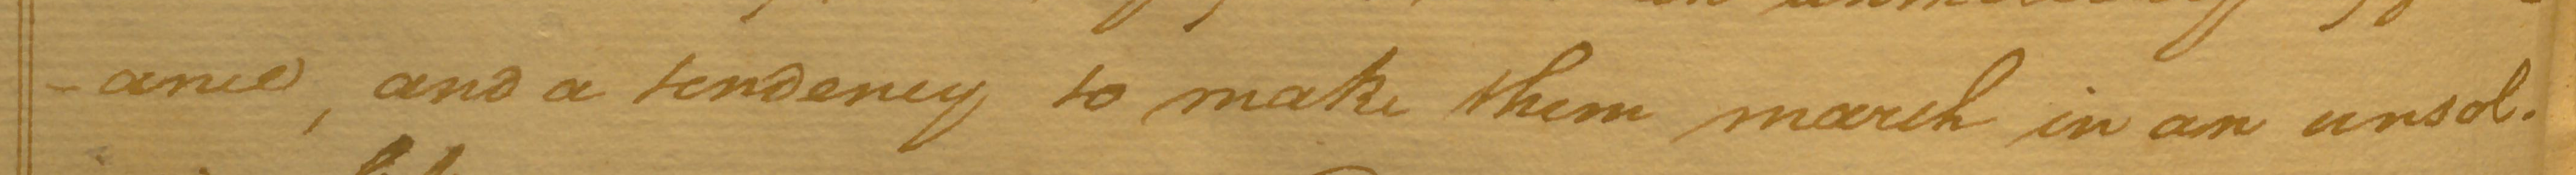-ance, and a tendency to make them march in an unsol-
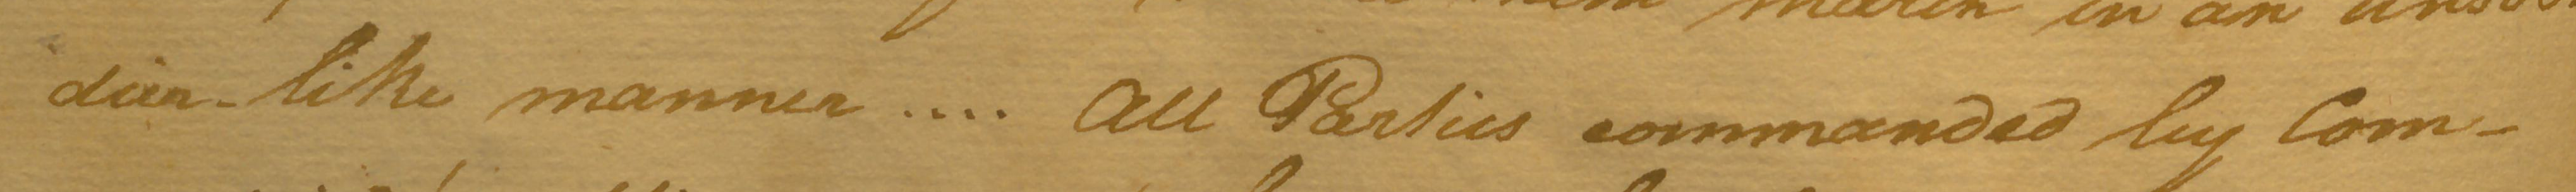dier-like manner.... All Parties commanded by Com-
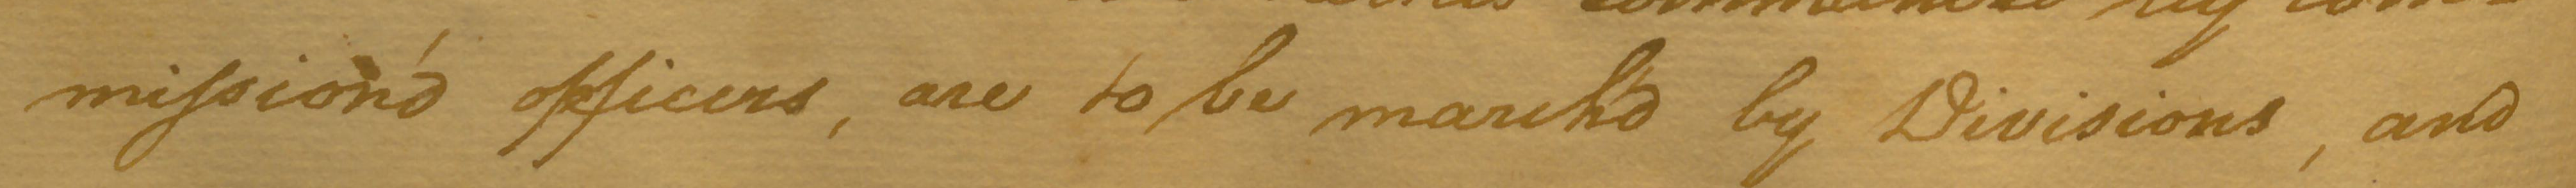mission'd officers, are to be march'd by Divisions, and
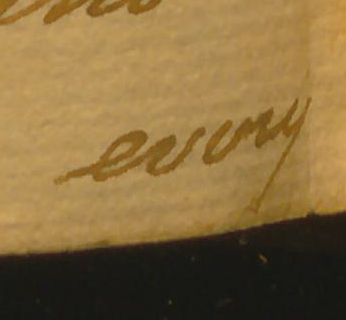every
